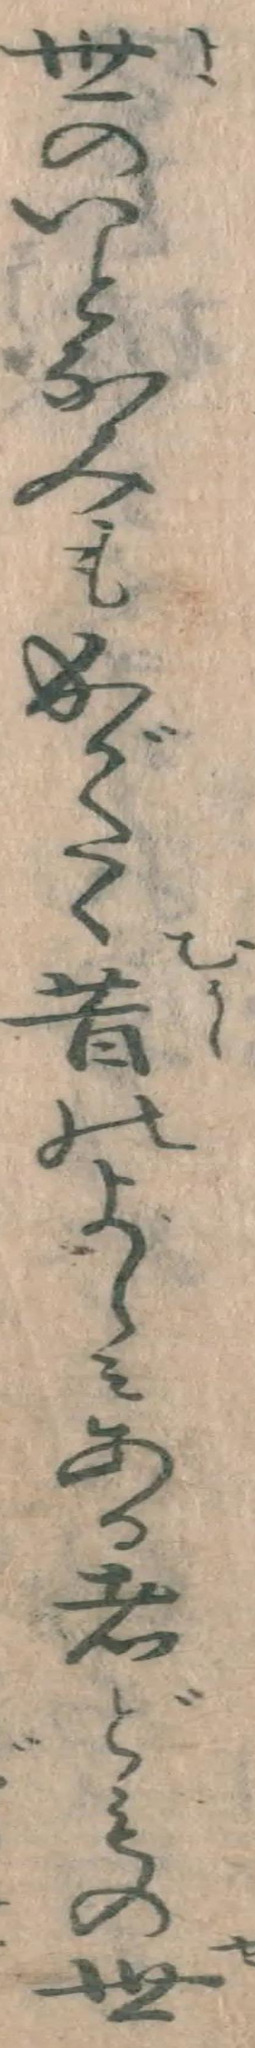世のいとなみも成がたく昔のよしみある者どもの世
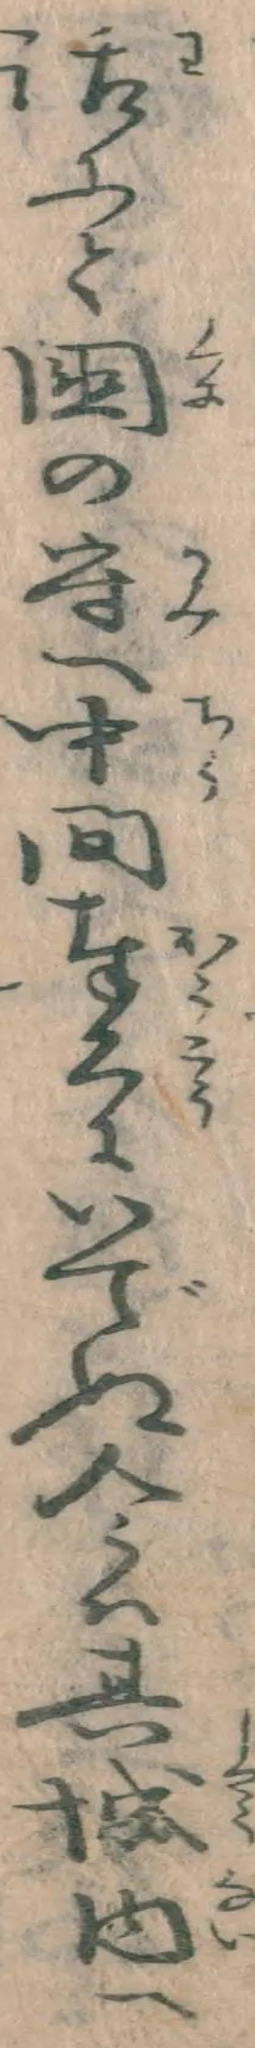話にと国の守へ中間奉公にいでぬ今は其城内へ
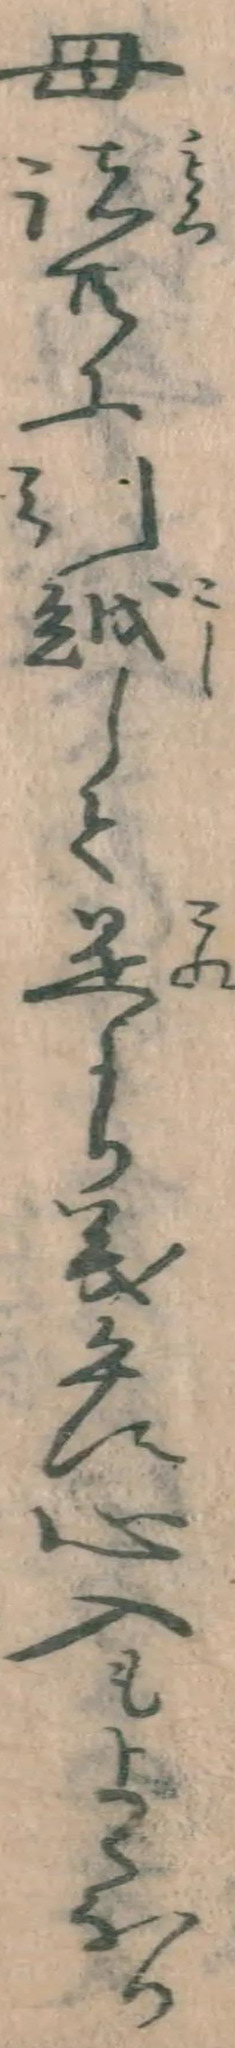母諸共に引越して是より義平次心入よくなり
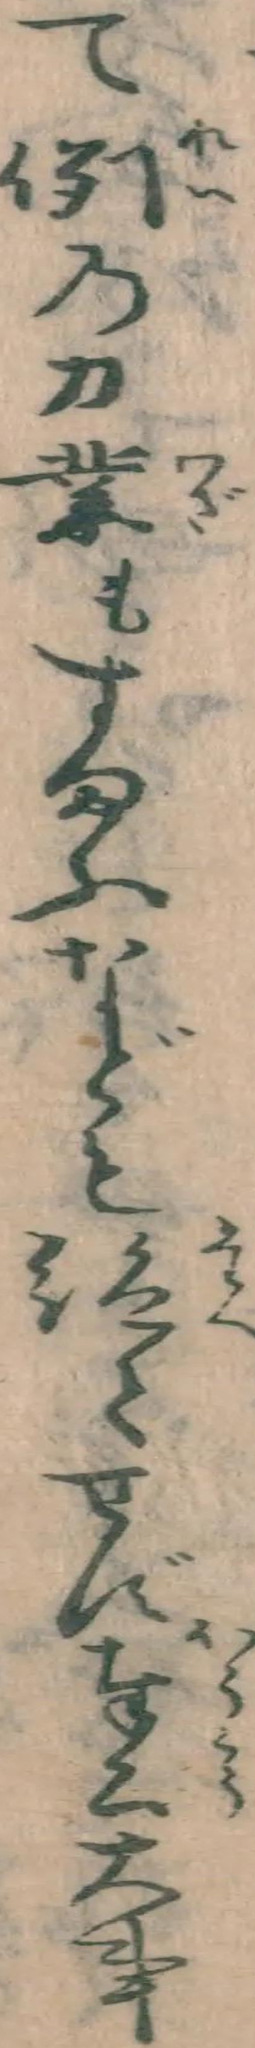て例の力業もすまふなども絶てせず奉公大事
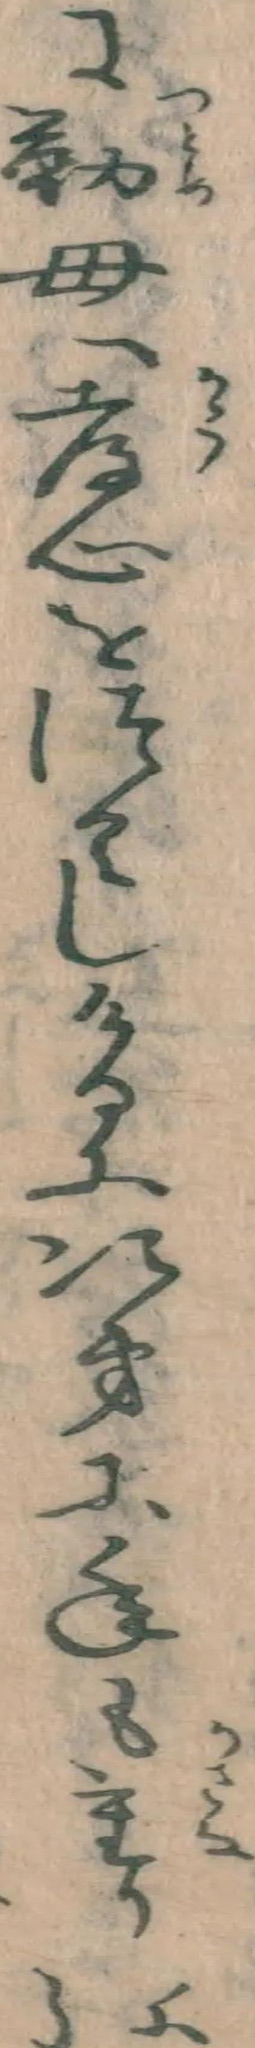に勤め母へ孝心をつくしけるに次第に年も重り弥
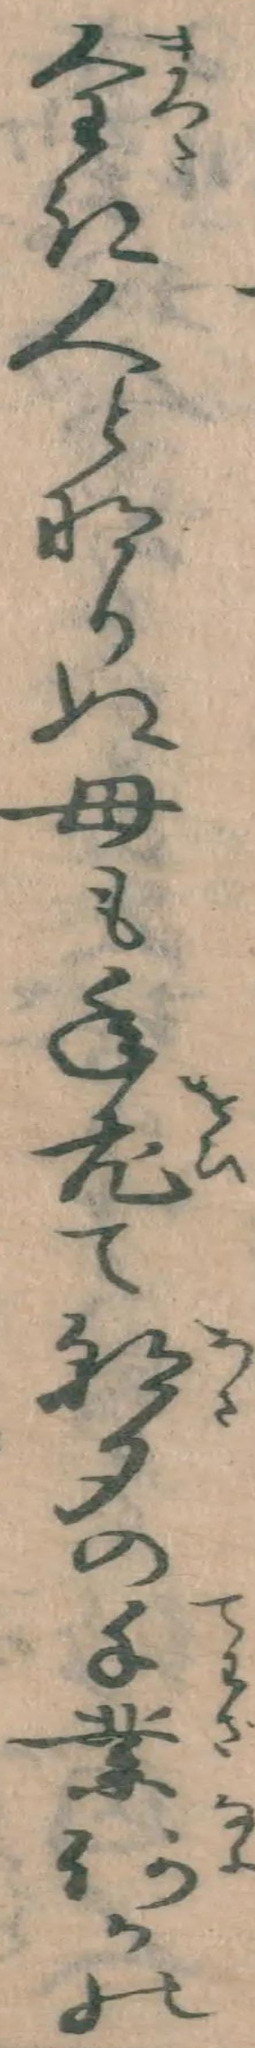全き人となりぬ母も年老て朝夕の手業何かの
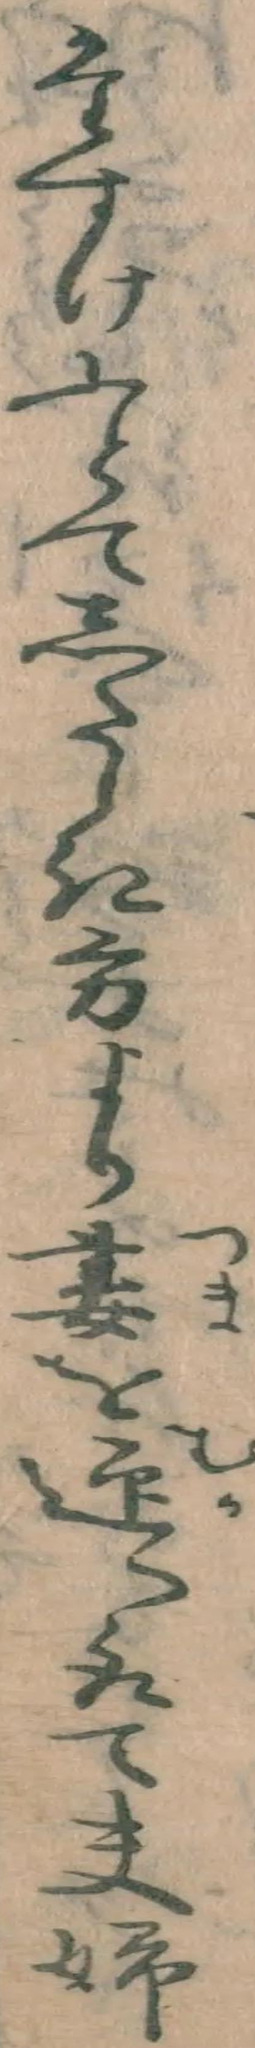たすけにとてしたしき方より妻を迎へ取て夫婦
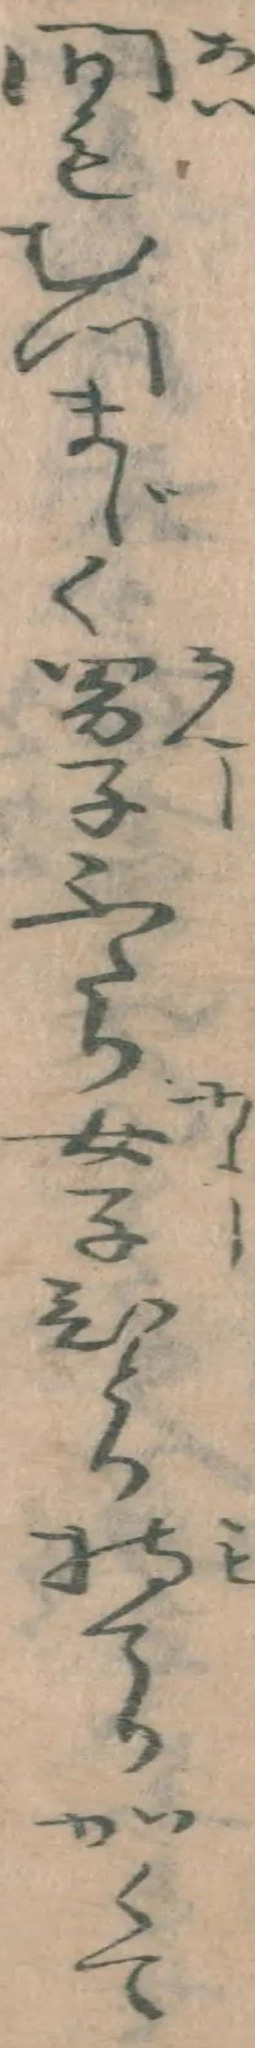間もむつまじく男子ふたり女子ひとり持てりかくて
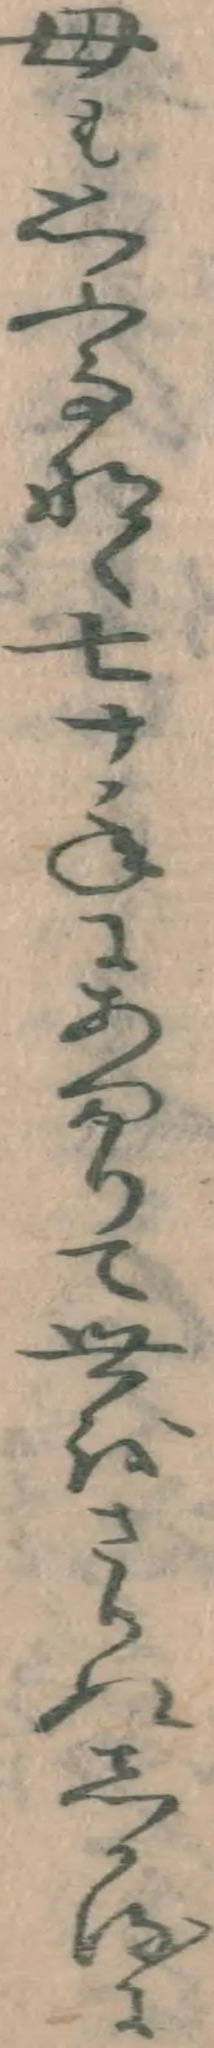母も思ふ事なく七十年にあまりて世をさりぬしかるに
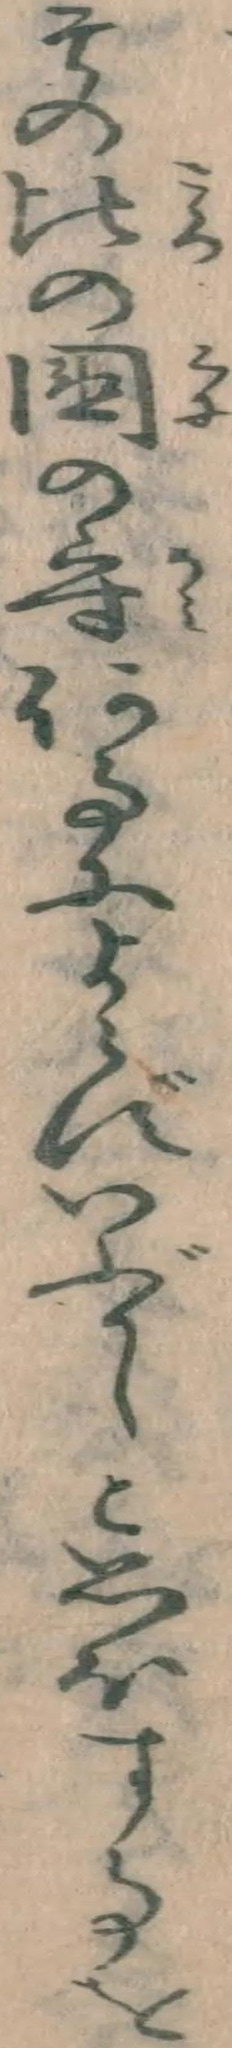その頃の国の守何事によらずいぶかしと思ほす事を
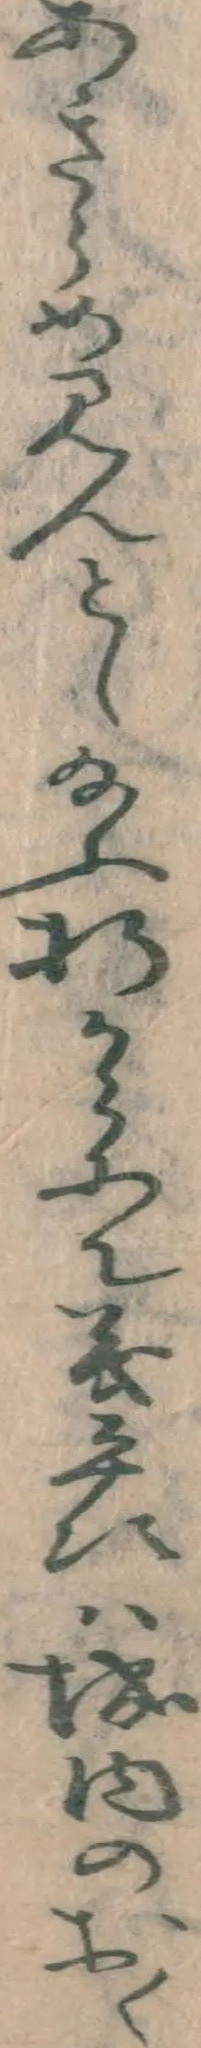あきらめ見んとし給ふ折からにて義平次は城内のおく
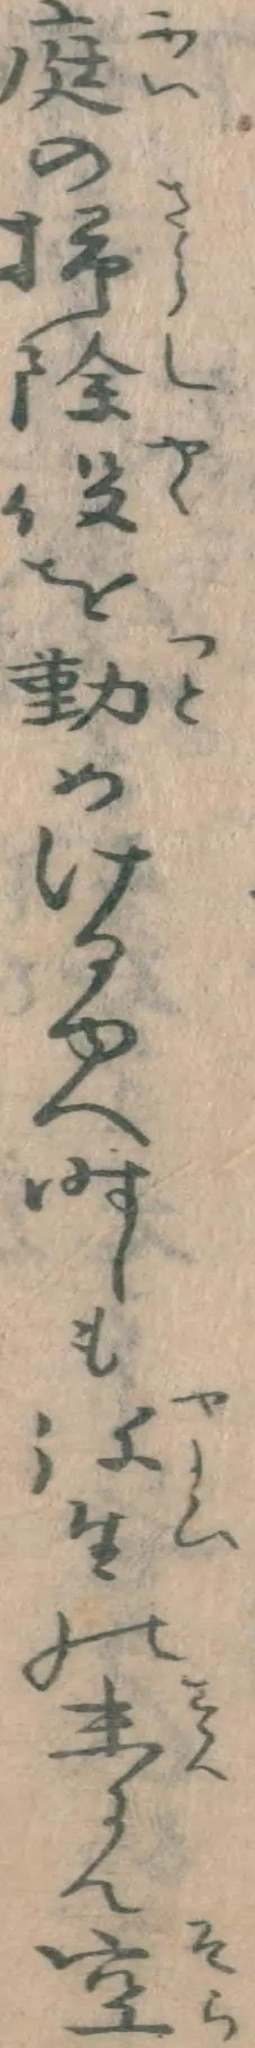庭の掃除役を勤めけるゆへ時しも弥生の末にて空
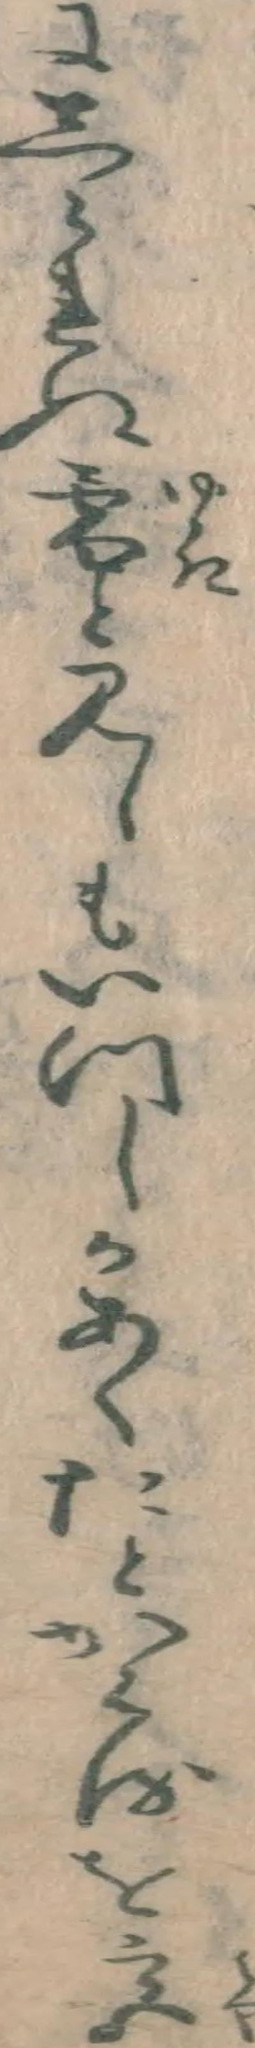にしられぬ雪と見しもいつしかあくたとかはるを宮
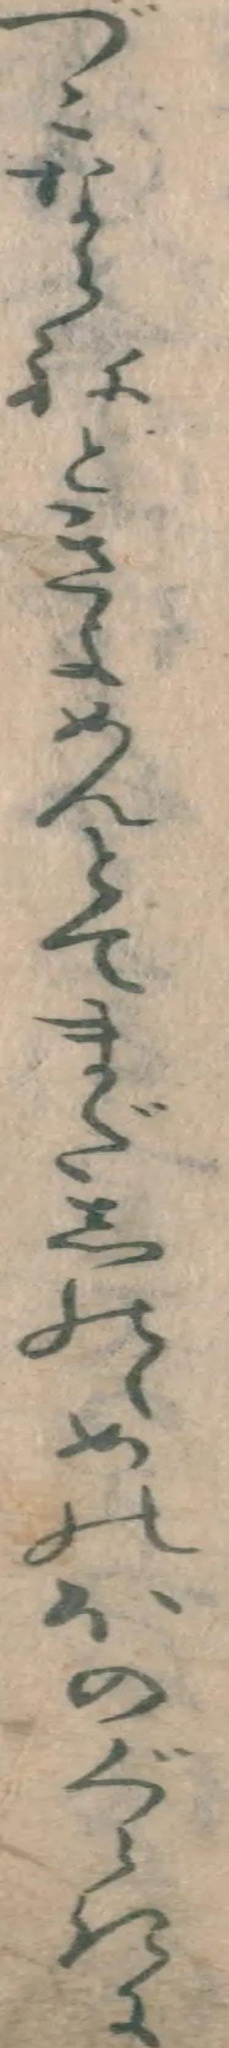づこならねときよめんとてまだしのゝめのほのぐらきに
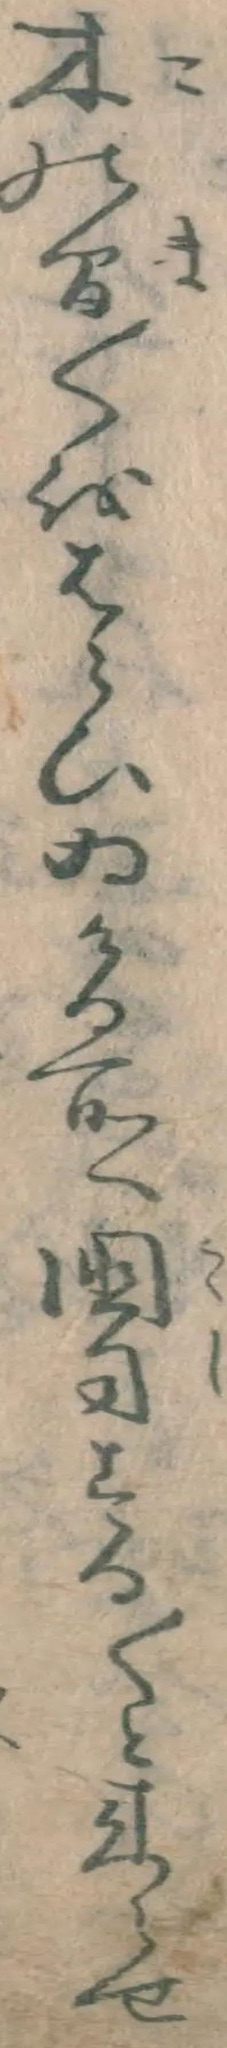木の間〳〵をはらひゐける所へ国司する〳〵と来らせ
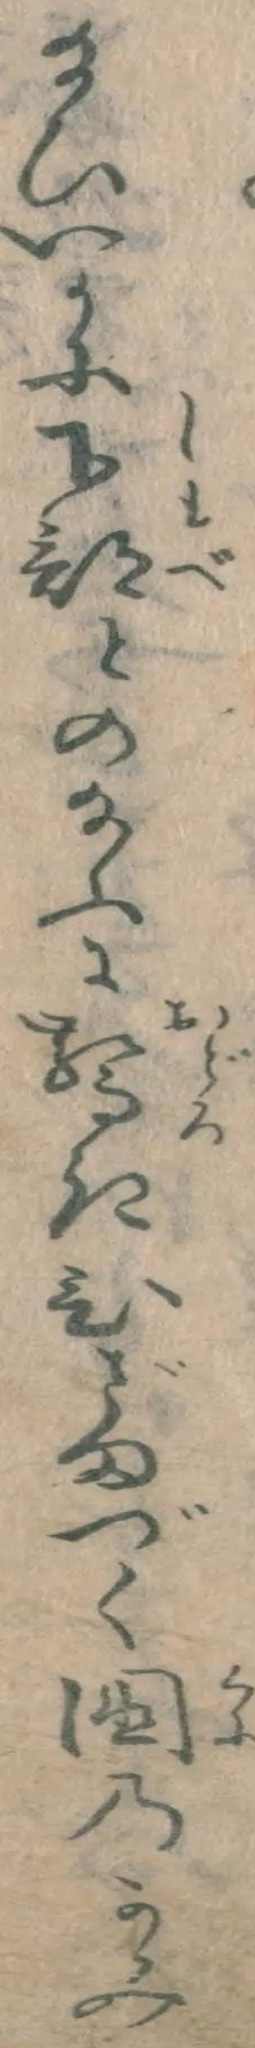給ひいかに下部との給ふに驚きひざまづく国のかみ
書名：怪談御伽童 5巻. [1]
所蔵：国立国会図書館 National Diet Library, JAPAN
